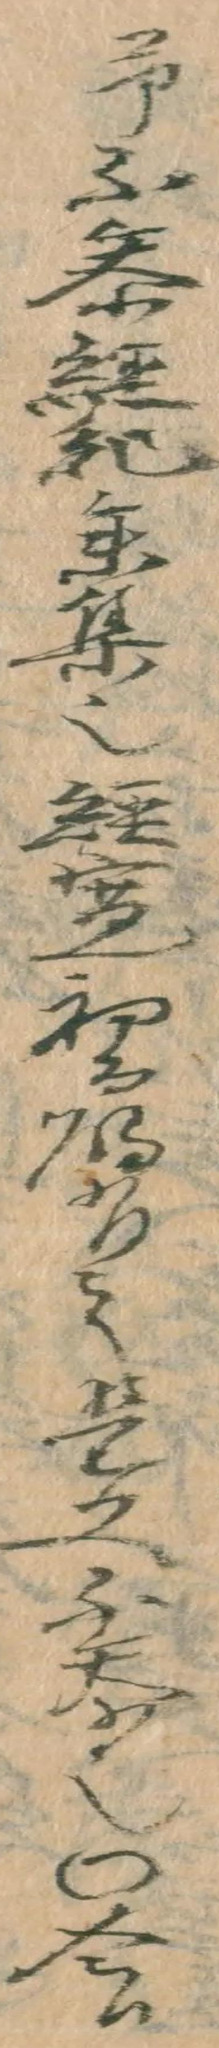予不参経紀参集也経寛初而觸有之是又不参也○今日
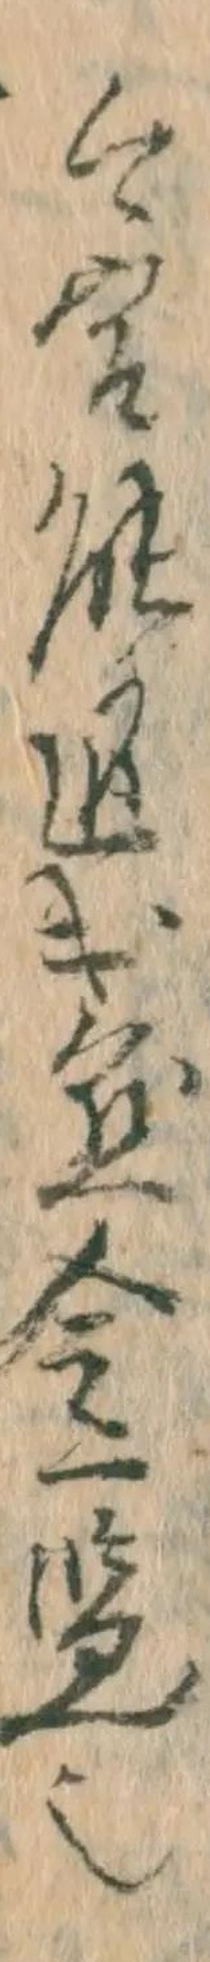今宮能退出懸令一覧也
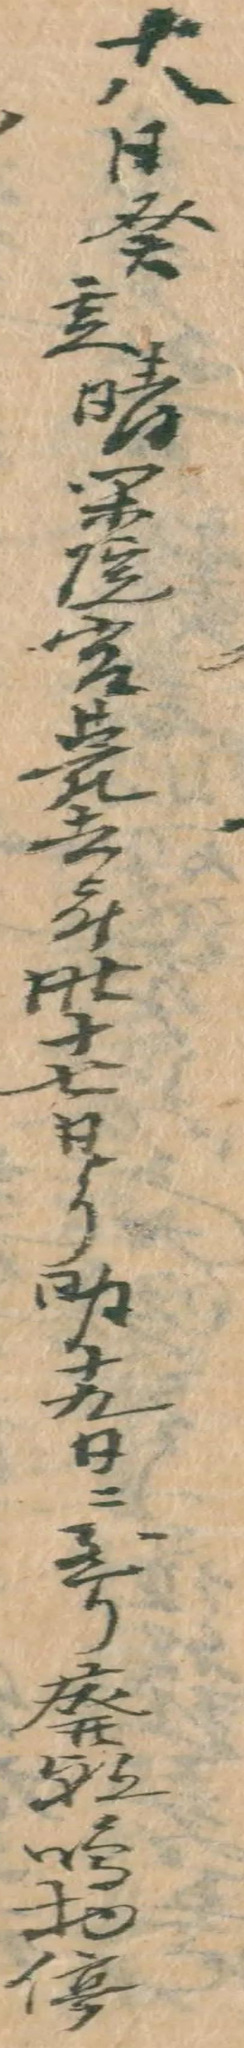十八日癸亥晴閑院宮薨去二付昨十七日より明十九日二至り廃朝鳴物停
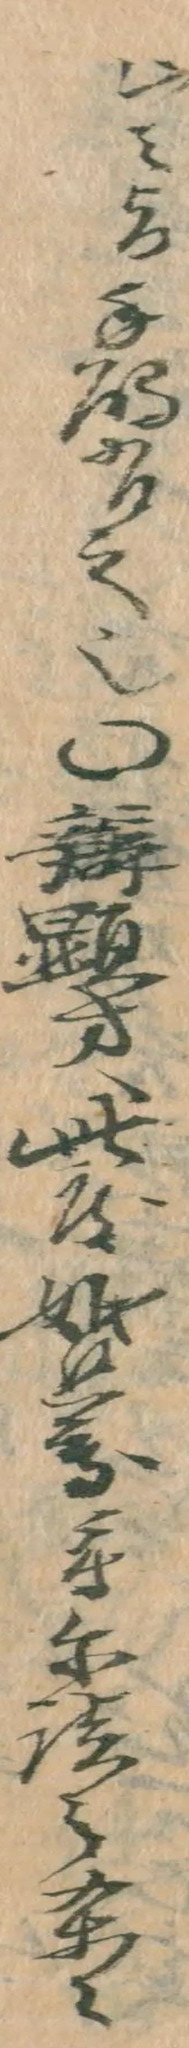止之旨手觸有之也〇辨顕方へ此度婚義ニ付示談之条々
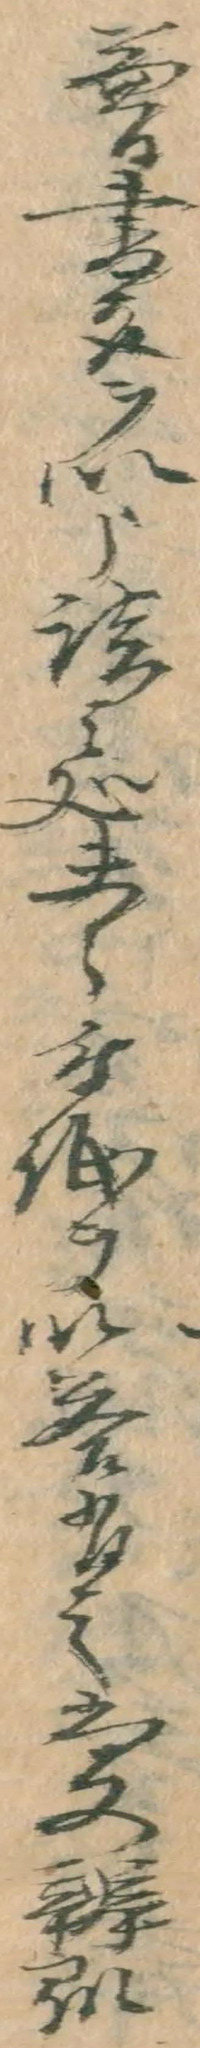兼日書取ヲ以申談候処夫々付紙ヲ以答有之尚又辨顕

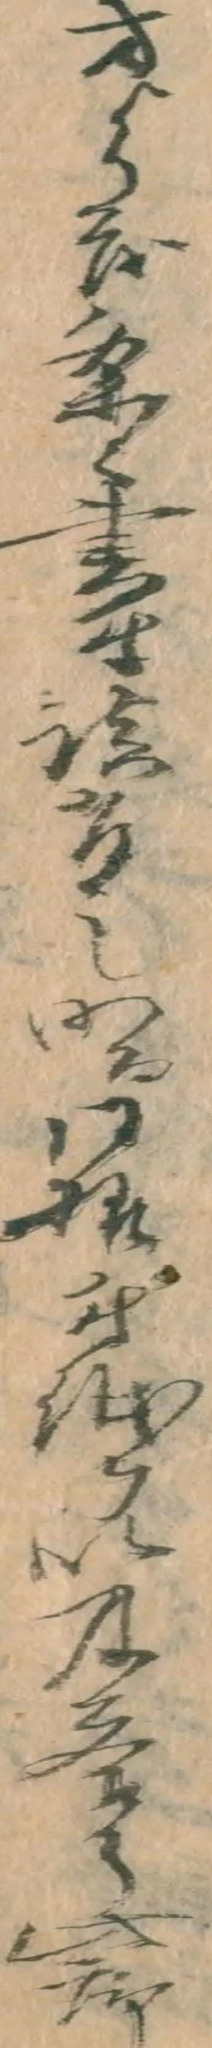方よりも条々書付談有也仍而同様ニ付紙ヲ以及答了此節
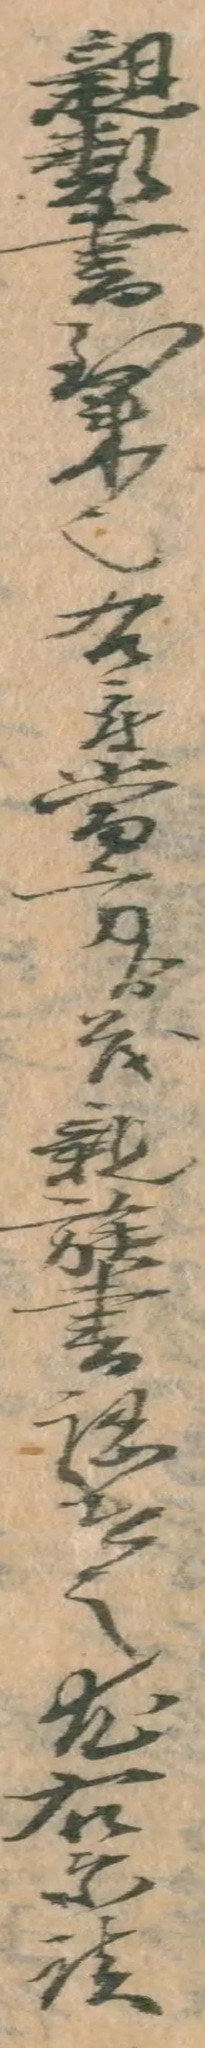親類書到来也右ニ付當方ゟも親族書認遣之尤右示談
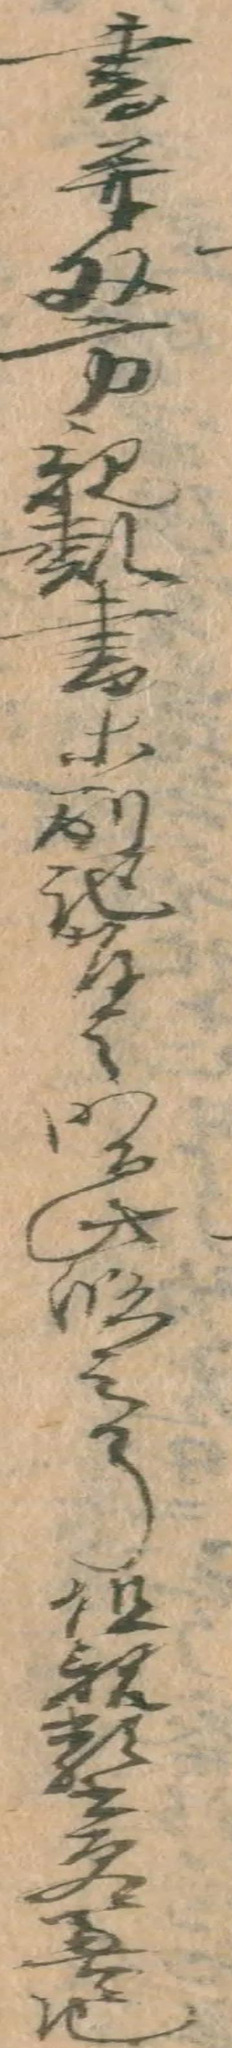書并双方親類書等別記有之仍而此段之了但親類更ニ互ニ記也
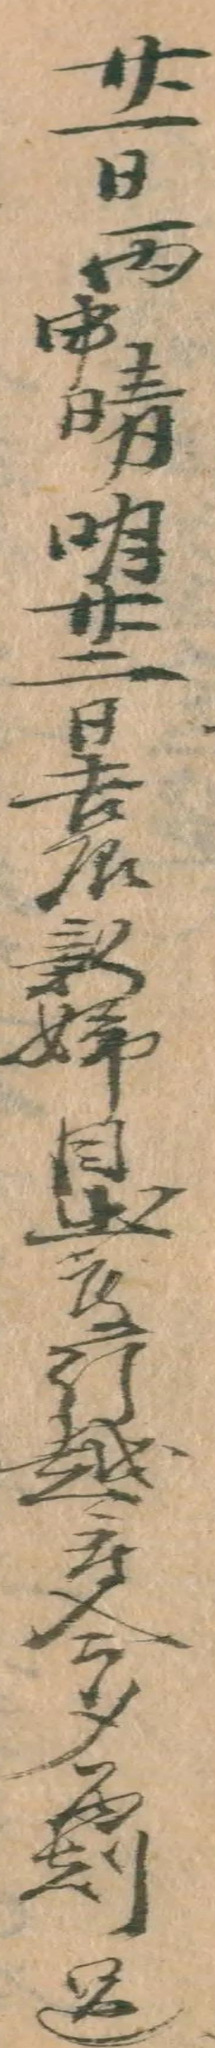廿一日丙申晴明廿二日吉辰新婦目出度引越ニ付今夕酉刻過
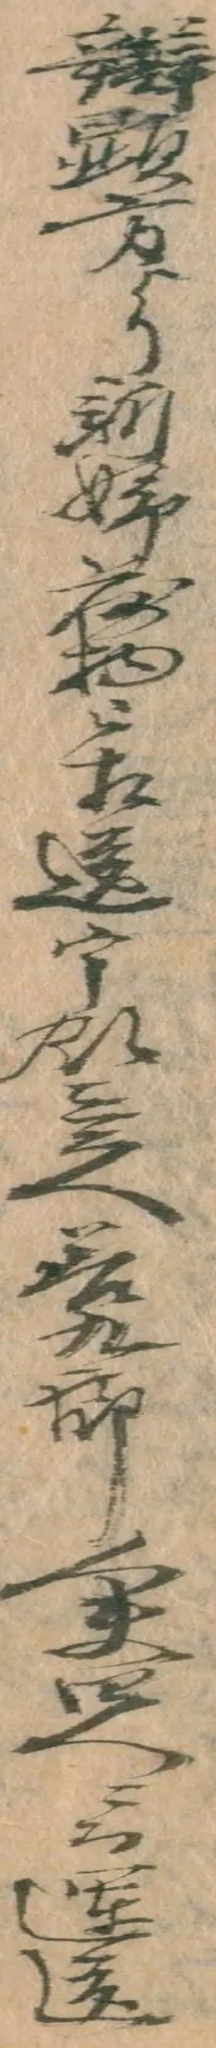辨顕方より新婦荷物被相送宇領壱人善九郎人夫四人ニ而運送
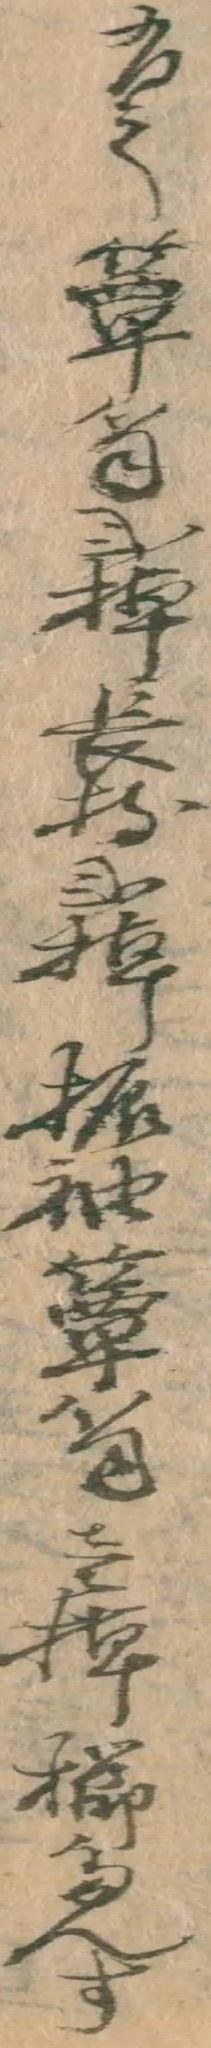有之箪笥弐棹長持弐棹振袖箪笥壱棹櫛たんす
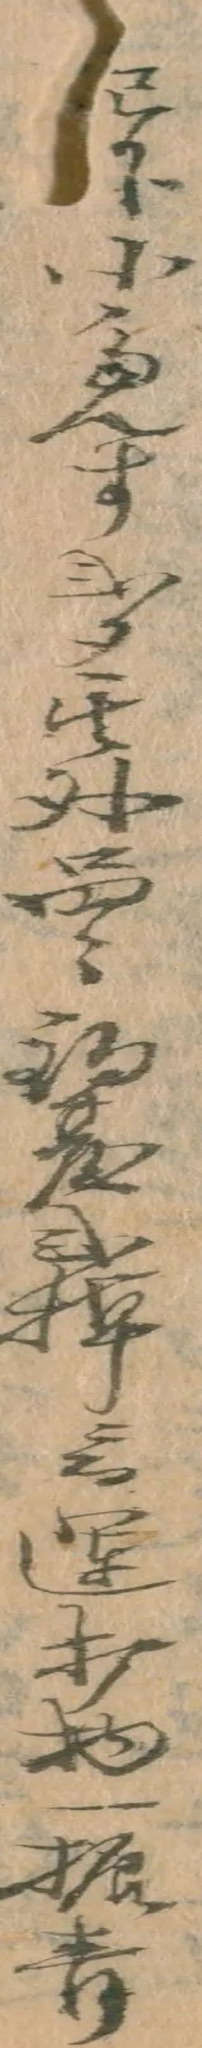已下小たんす弐〆其外品々釣䑓弐棹ニ而運打物一振青
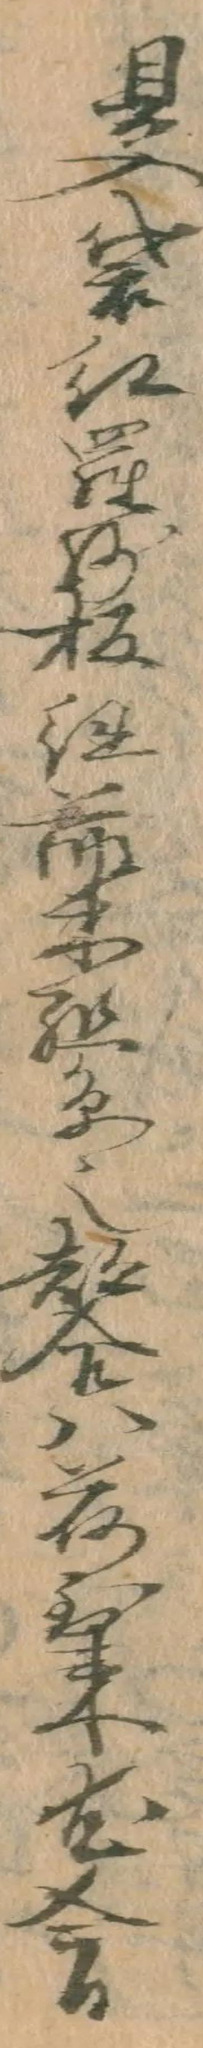具入袋紅羅紗板組節木組参也都合八荷到来尤今日
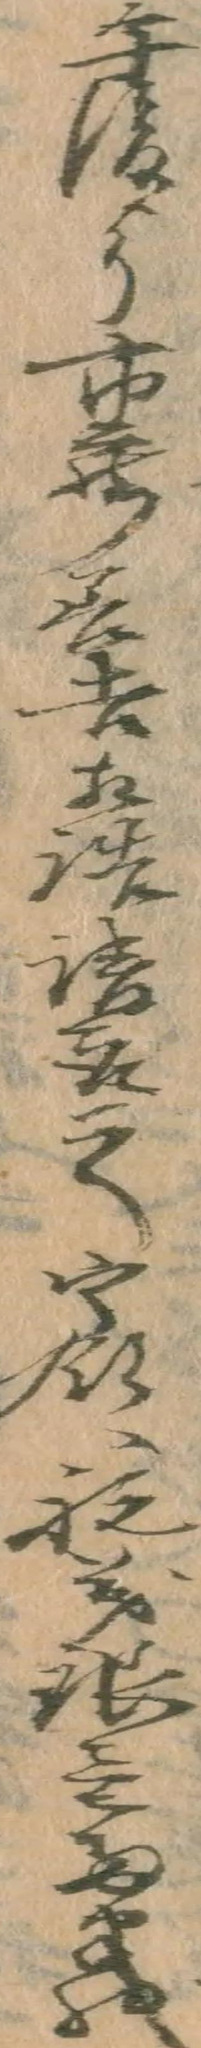午後より市蔵善吉相詰請取也宇領へ祝義銀壱両半紙
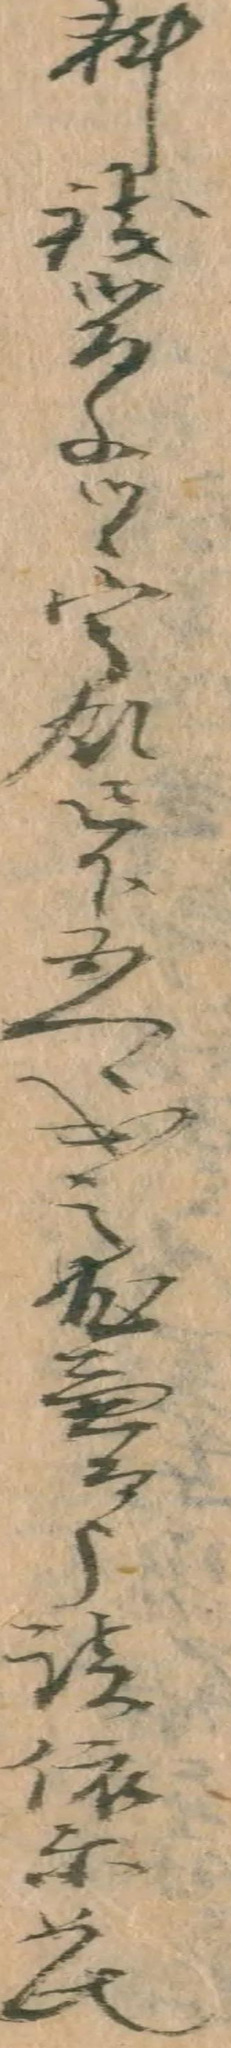料銭弐百文ツヽ宇領已下五人へ出之尤兼而申談依爾如此
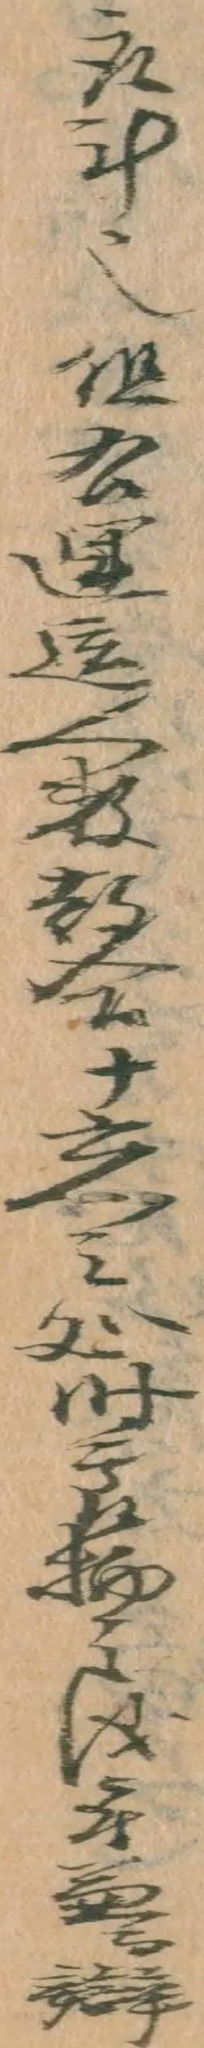取斗也但右運送人数都合十六人之処時節物之儀ニ付兼而辨
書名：賀茂社記録. 第69冊
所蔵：国立国会図書館 National Diet Library, JAPAN
